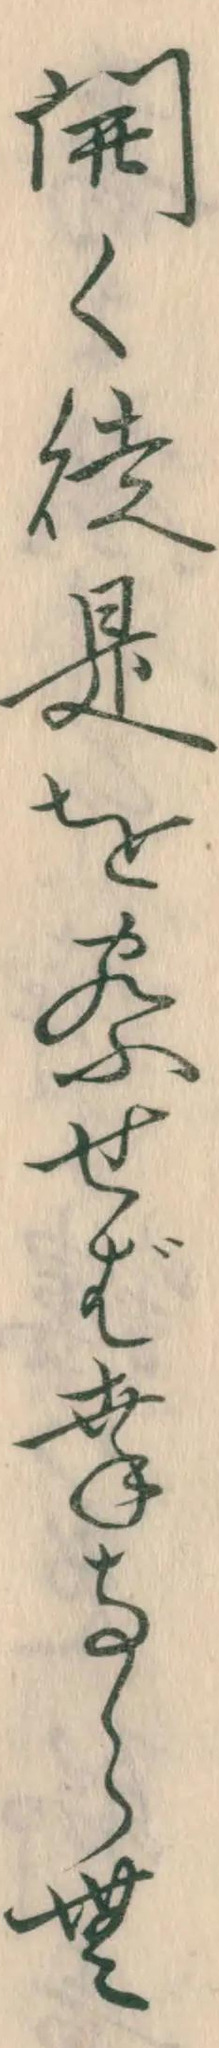開く徒是を察せば幸ならむ
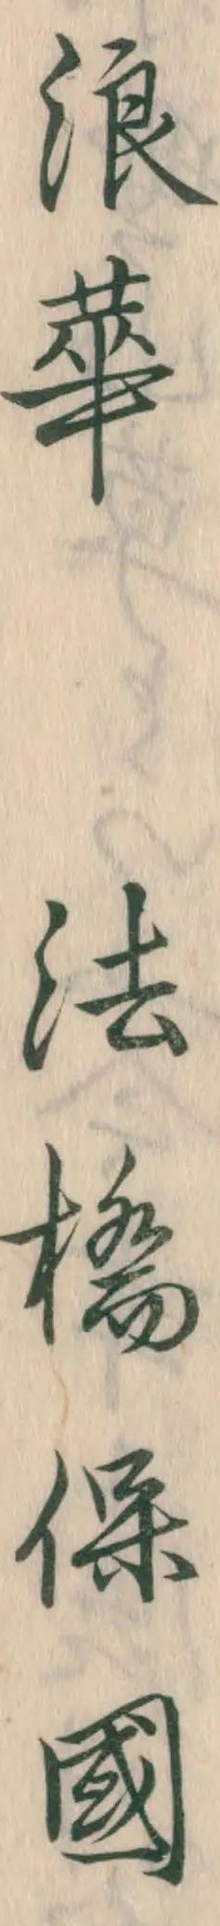浪華法橋保国
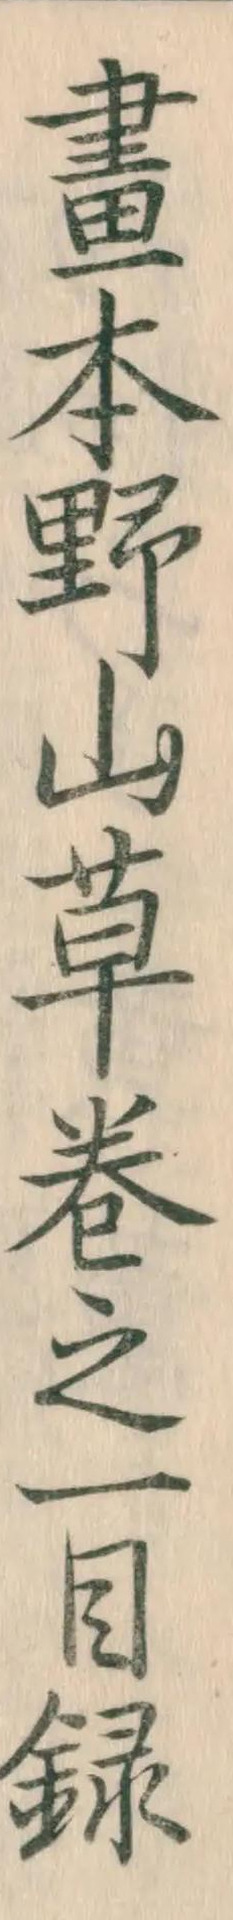画本野山草巻之一目録
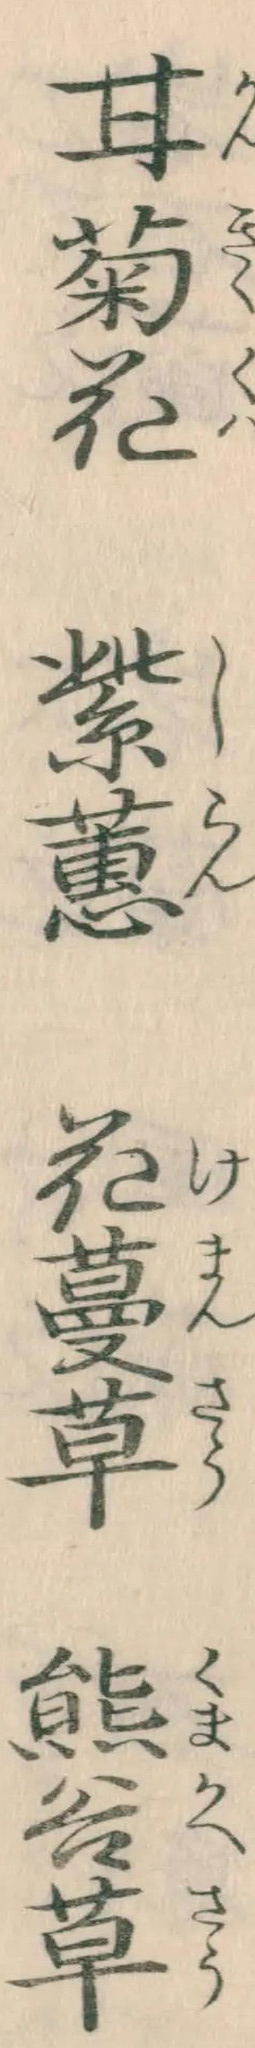甘菊花紫蕙花蔓草熊谷草
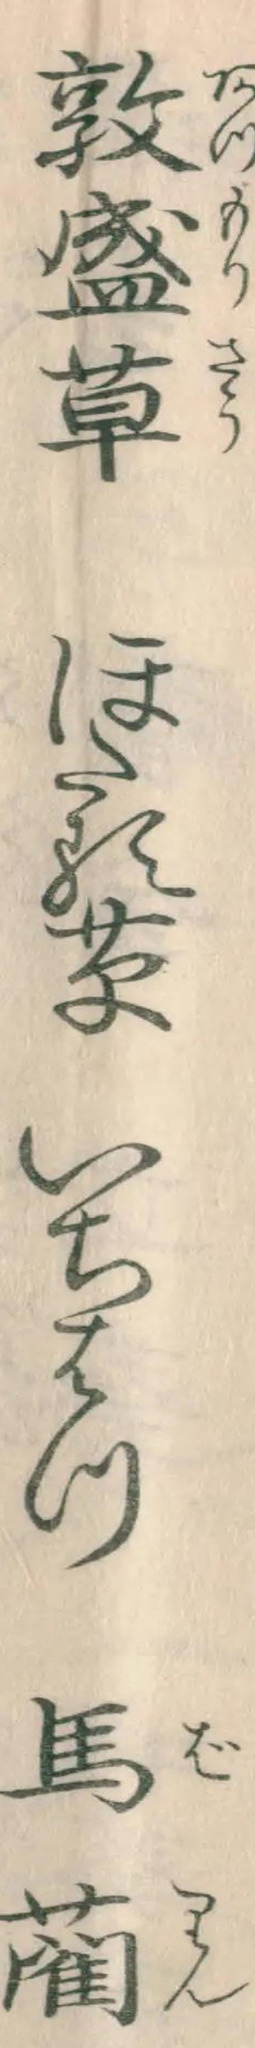敦盛草ほたる草いちはつ馬藺
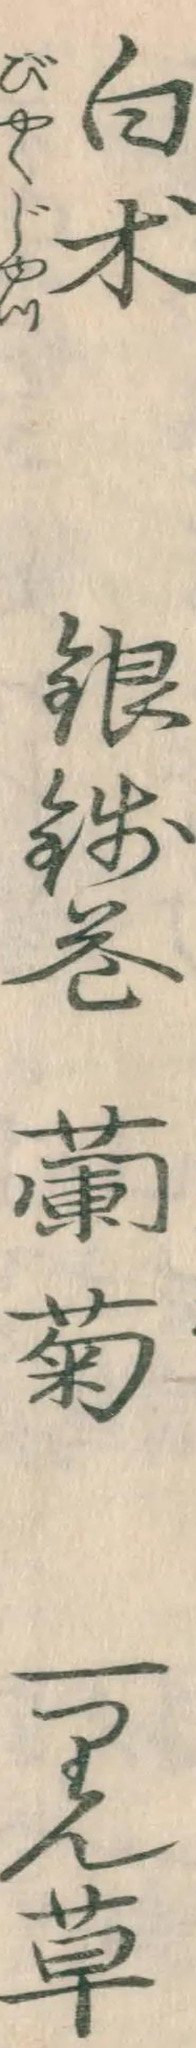白朮銀銭花蘭菊一りん草
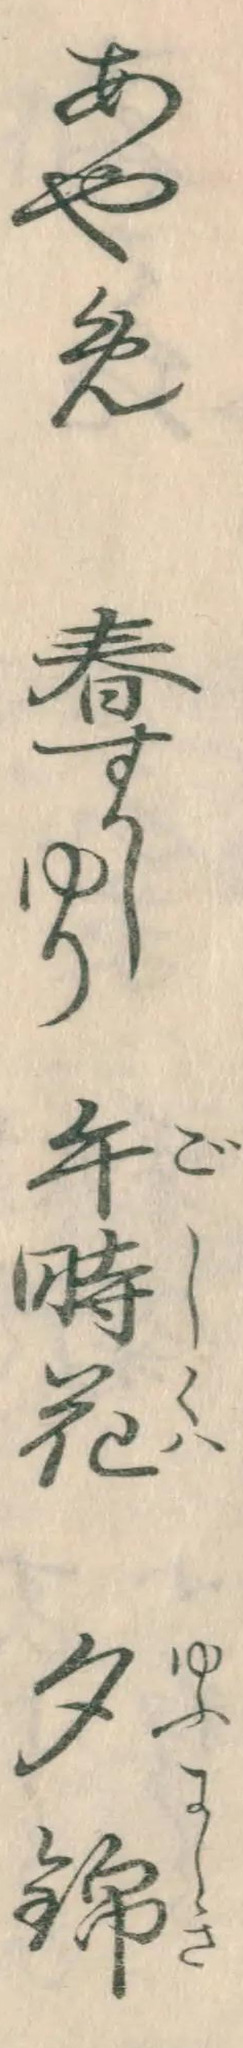あやめ春すかしゆり午時花夕錦
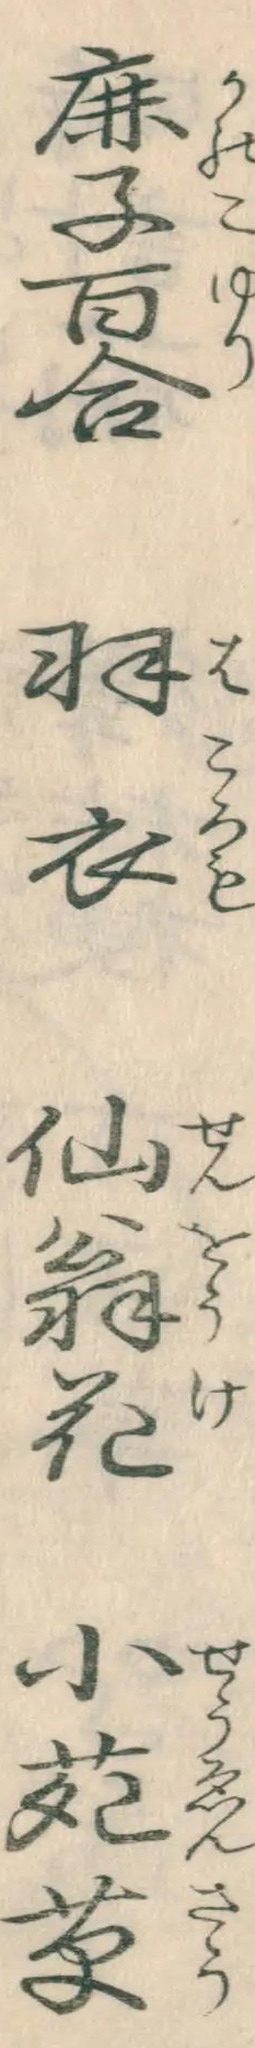鹿子百合羽衣仙翁花小苑草

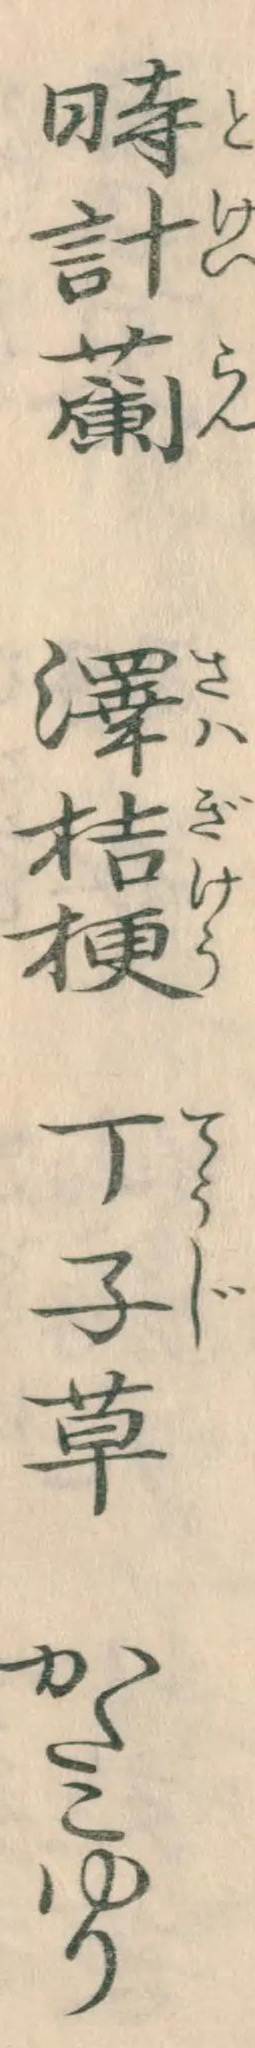時計蘭沢桔梗丁子草かたこゆり
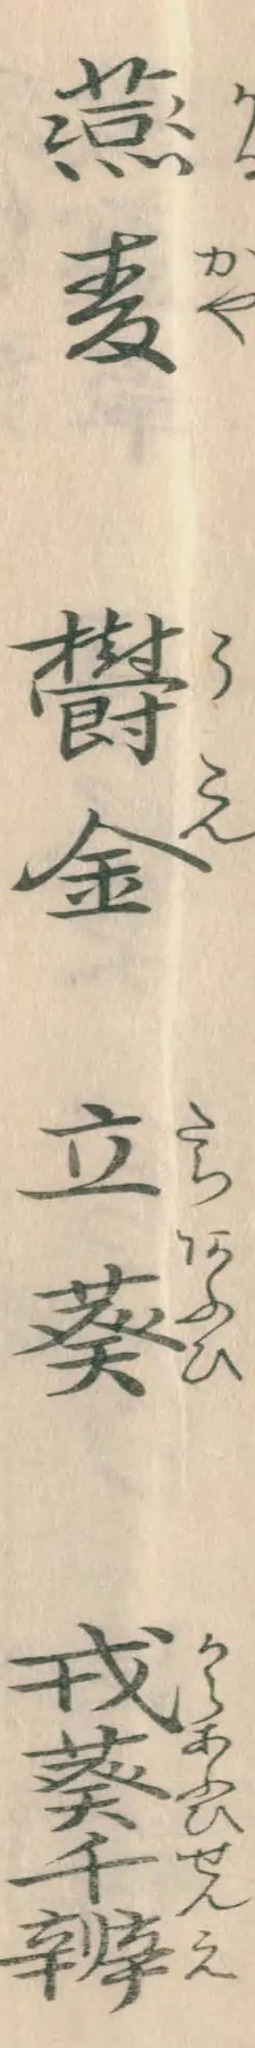燕麦鬱金立葵戎葵千弁
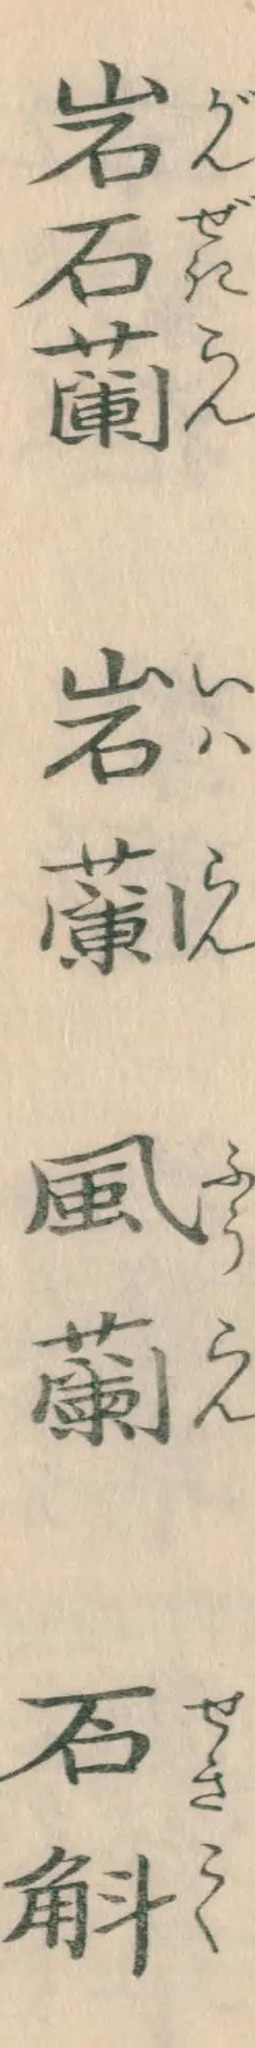岩石蘭岩蘭風蘭石斛
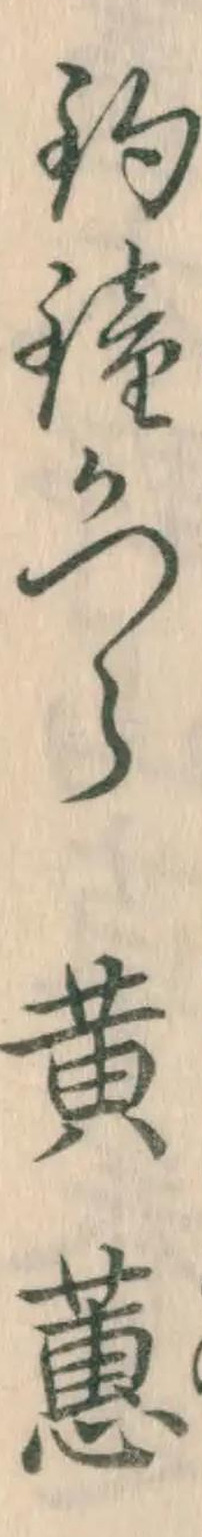釣鐘かつら黄蕙
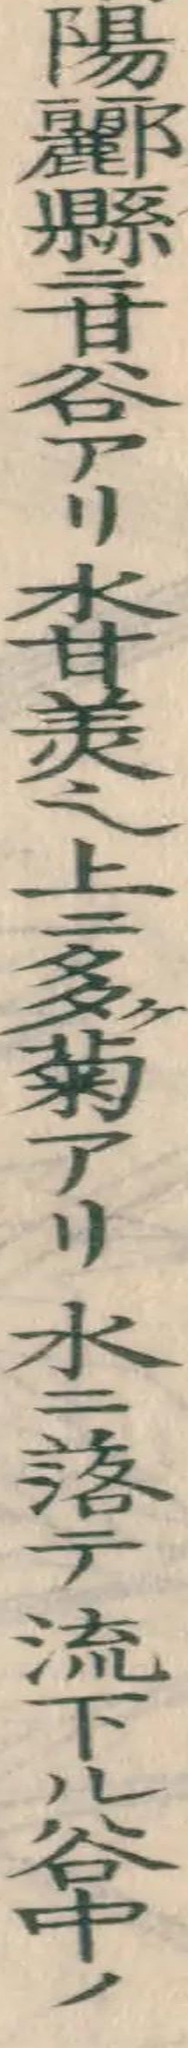南陽酈県ニ甘谷アリ水甘美也上ニ多菊アリ水ニ落テ流下ル谷中ノ
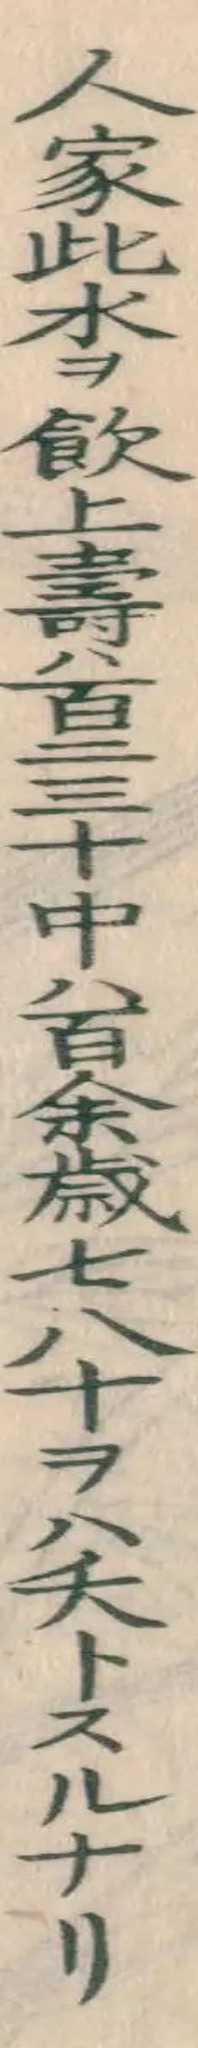人家此水ヲ飲上寿ハ百二三十中ハ百余歳七八十ヲハ夭トスルナリ

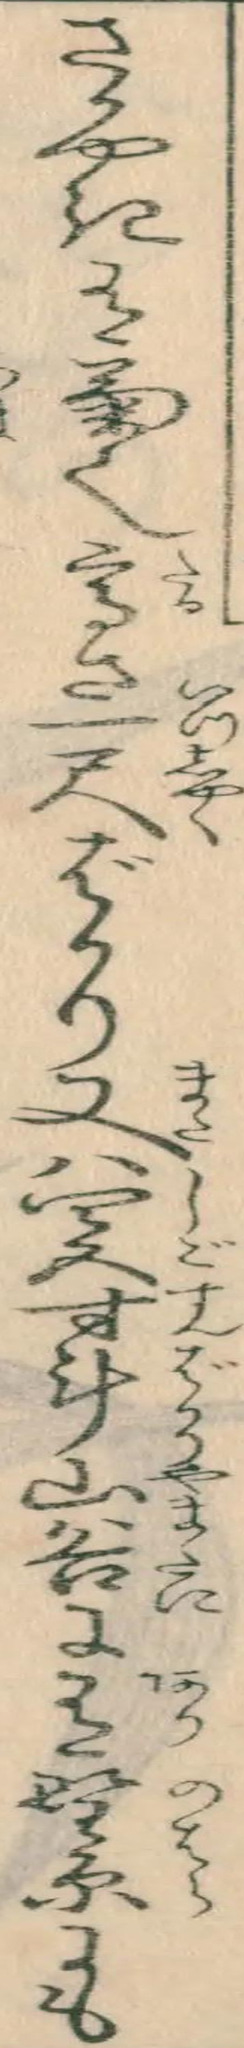さかやき有菊也高さ一尺ばかり又は四五寸斗山谷に有野原にも
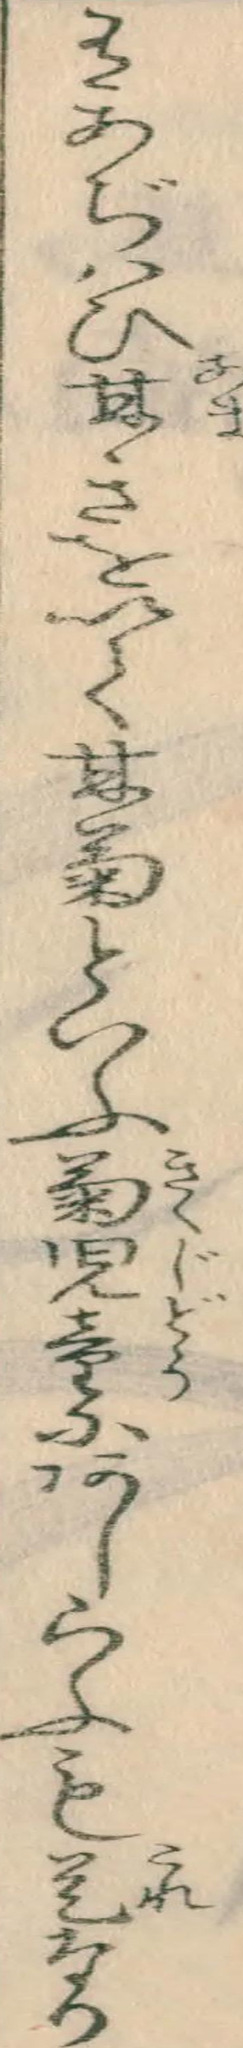有あぢはひ甘きを以て甘菊といふ菊児童にあしらふも是なり
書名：畫本野山草. [1]
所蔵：国立国会図書館 National Diet Library, JAPAN
